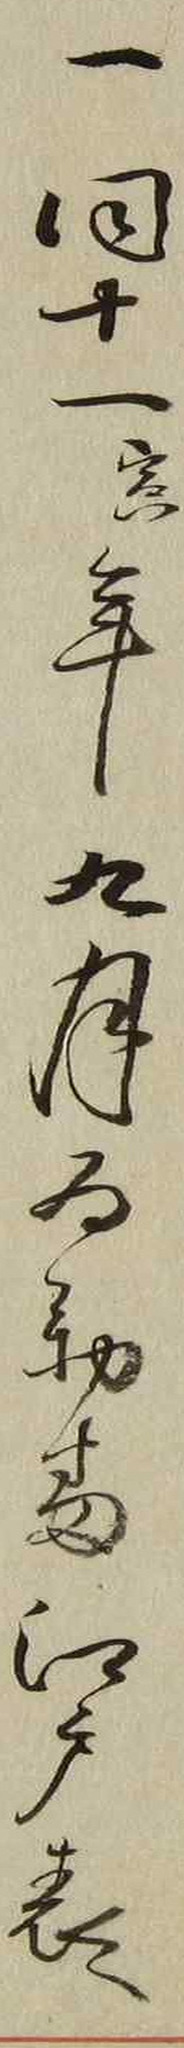一同十一寅年九月為勤番江戸表へ
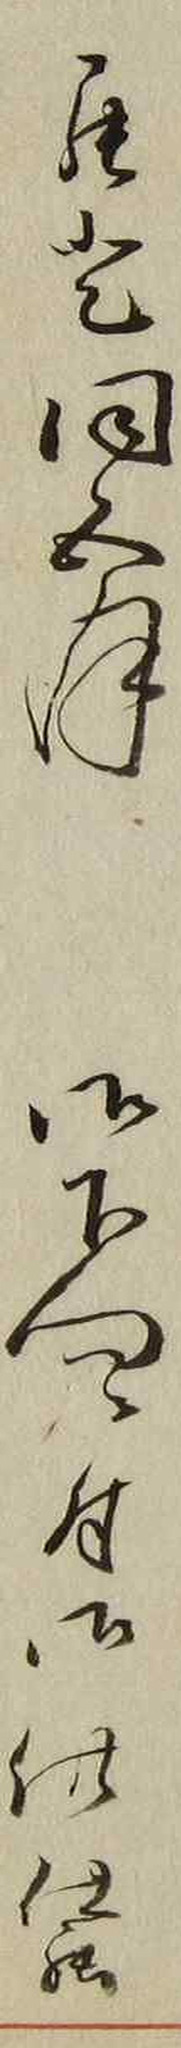罷登同五月御下向ニ付御供仕罷
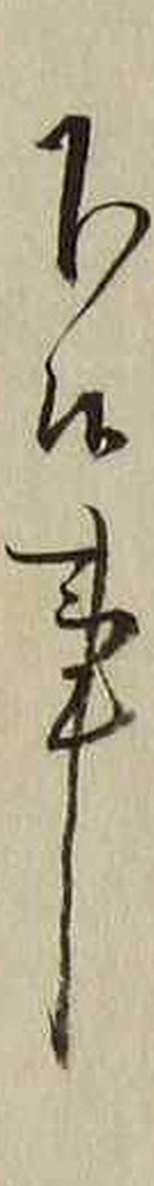下候事
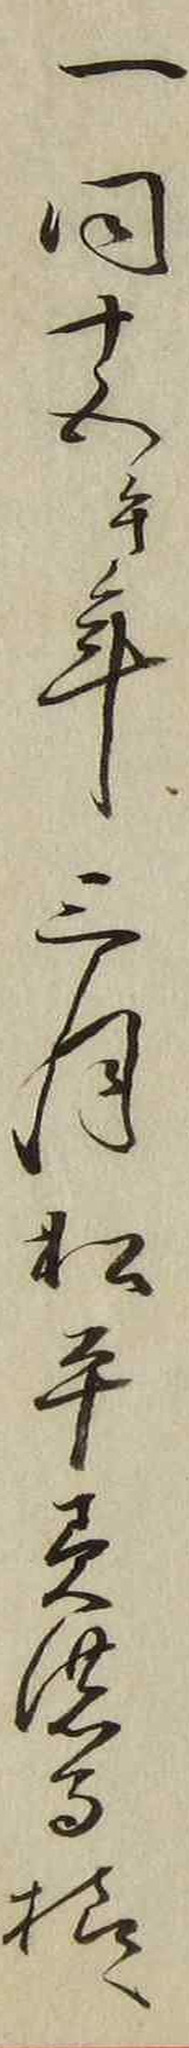一同十五午年三月松平美濃守様へ
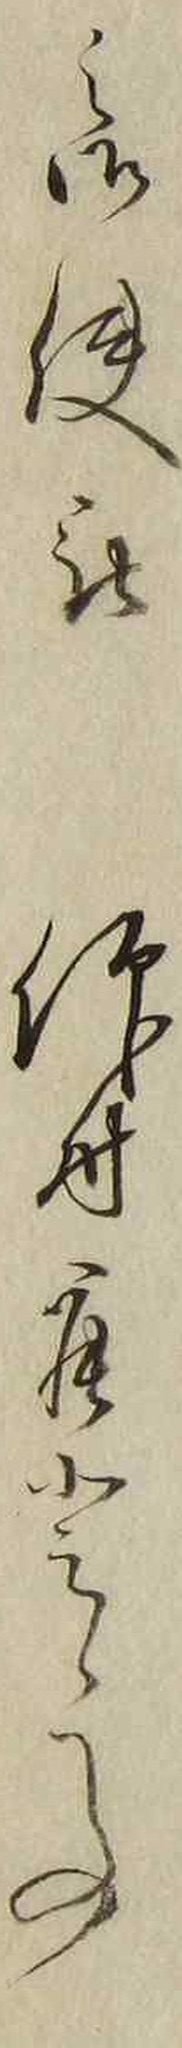之御使被仰付罷登候事

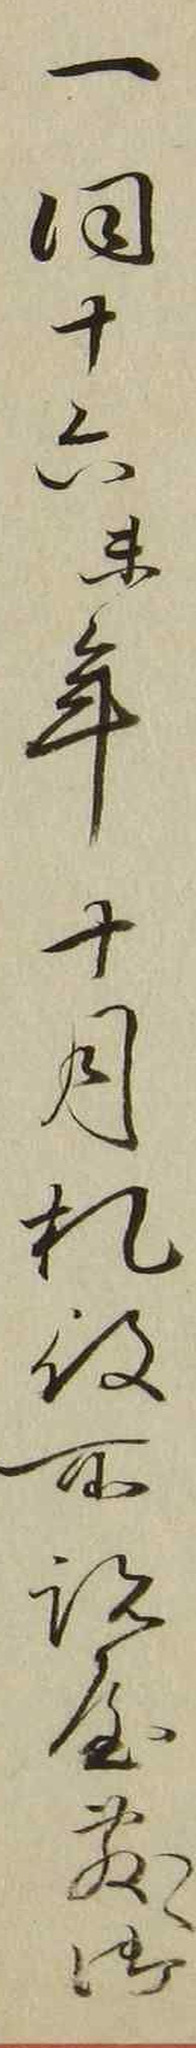一同十六未年十月札役所跡屋敷御
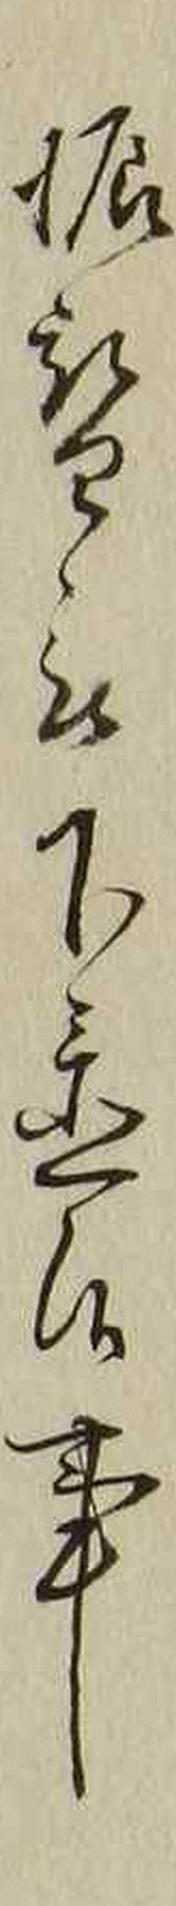振替被下置候事
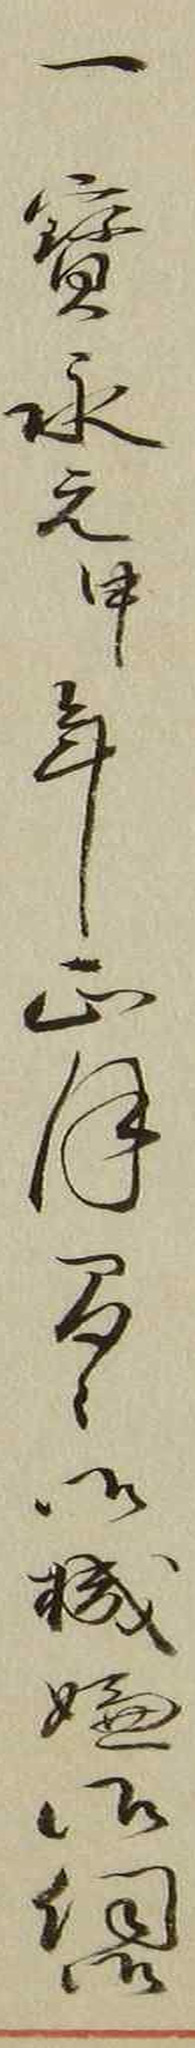一宝永元申年正月間々御機嫌御伺御
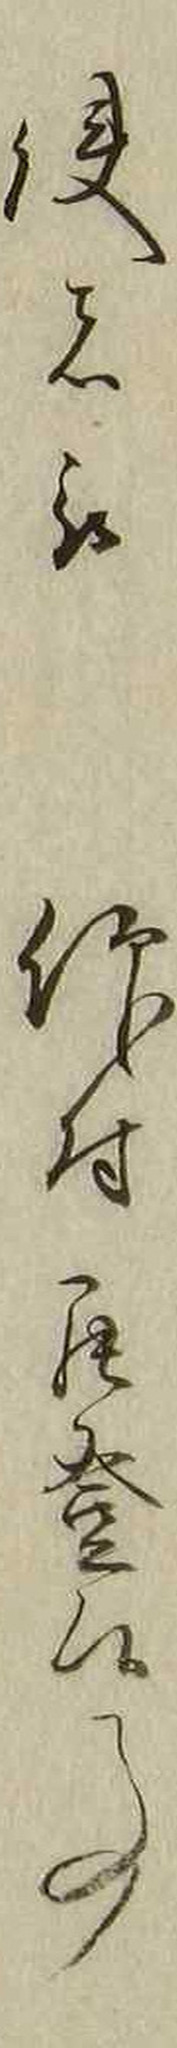使者被仰付罷登候事
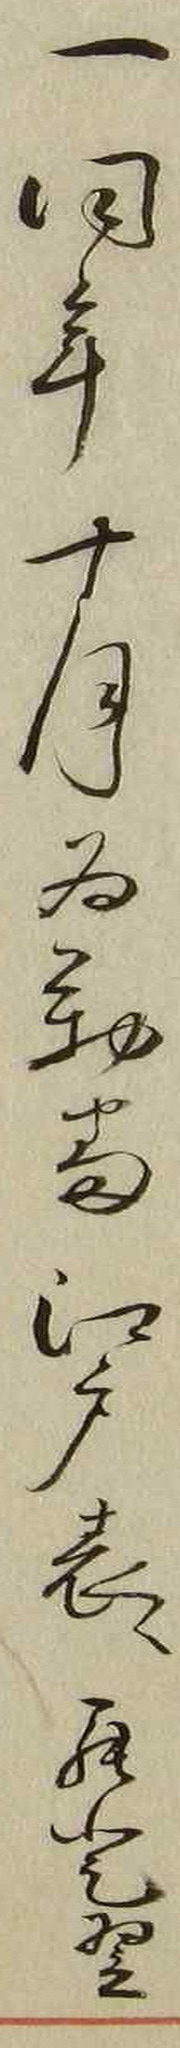一同年十月為勤番江戸表へ罷登翌
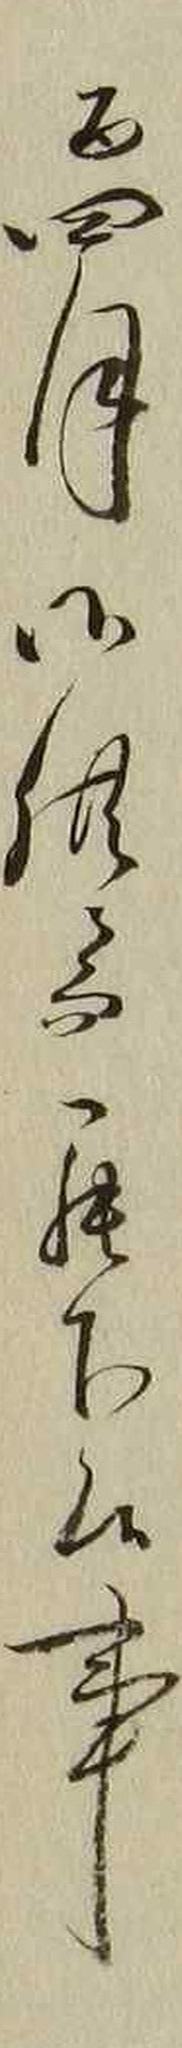酉四月御供ニ而罷下候事
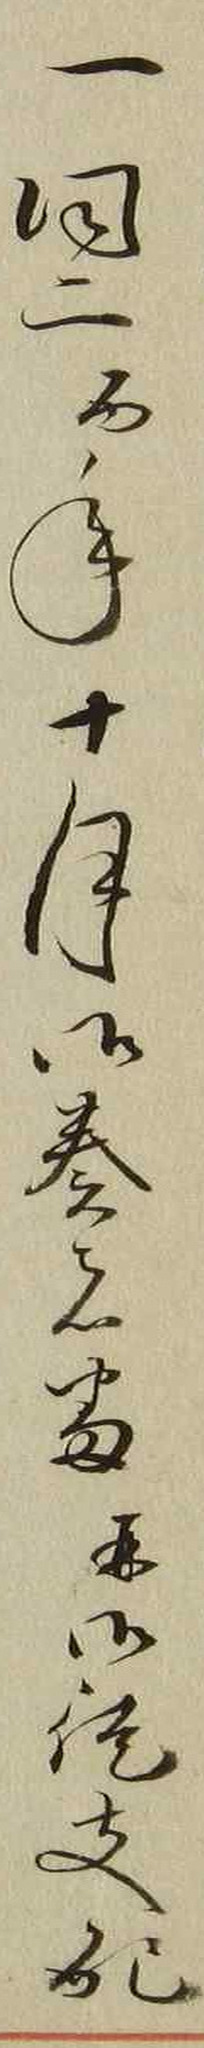一同二酉年十月御奏者番兼御徒支配
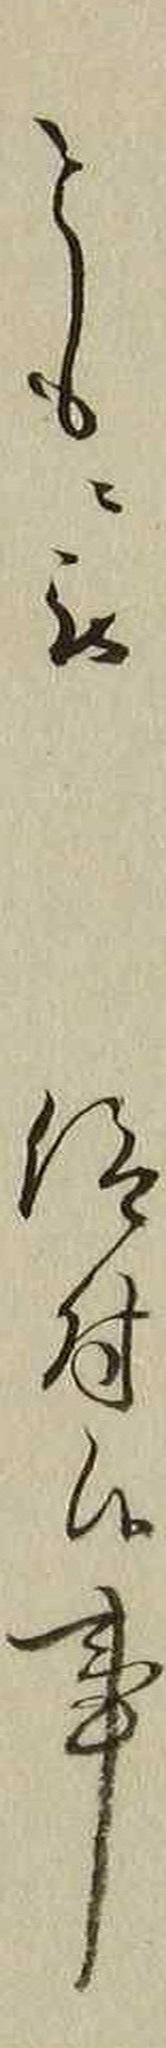ともニ被仰付候事
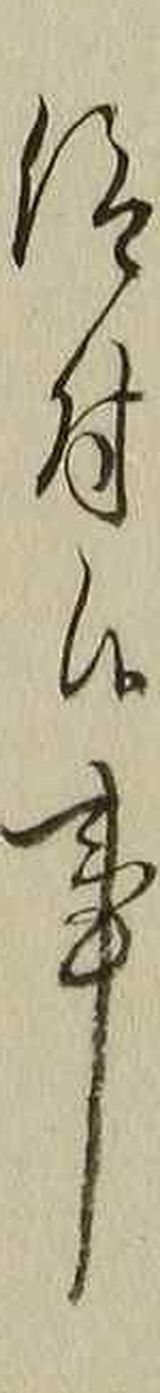仰付候事
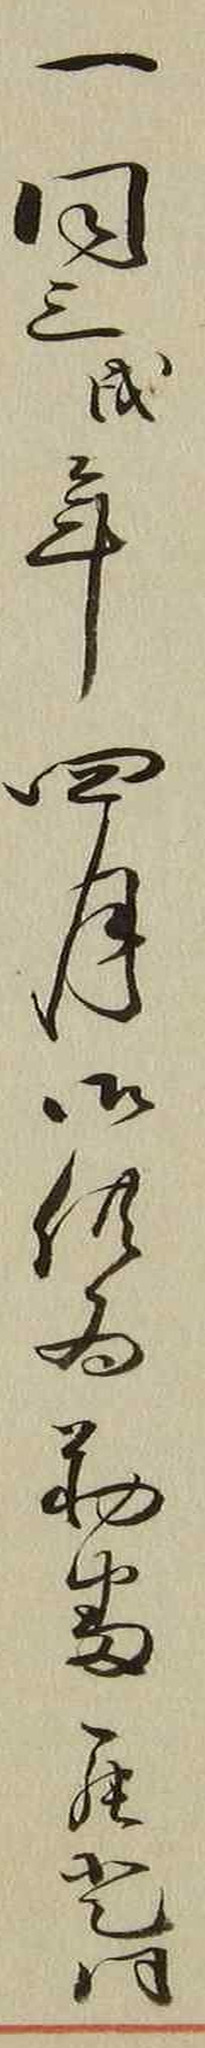一同三戌年四月御供為勤番罷登同
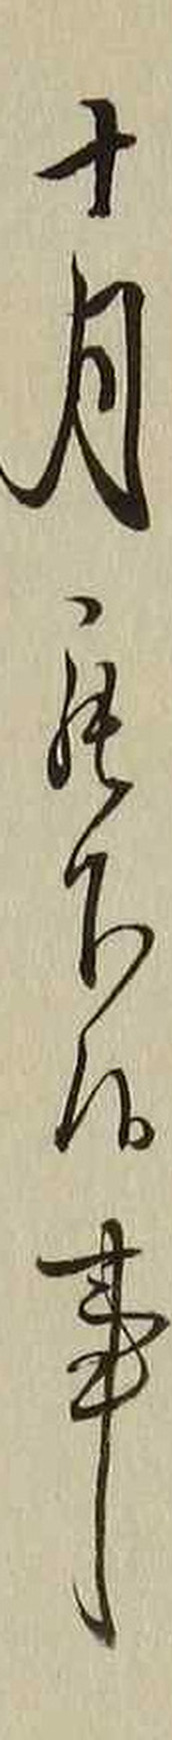十月罷下候事
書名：諸士系譜　巻之2　い之部2
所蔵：会津若松市立会津図書館
